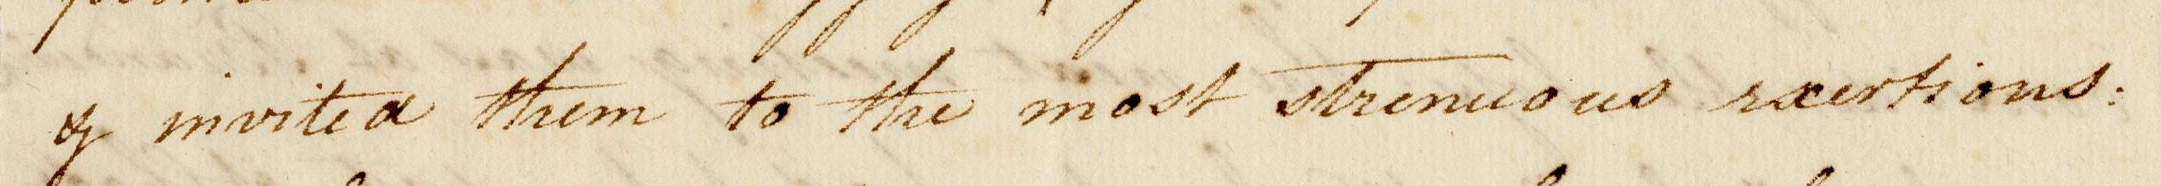& invited them to the most strenuous exertions:
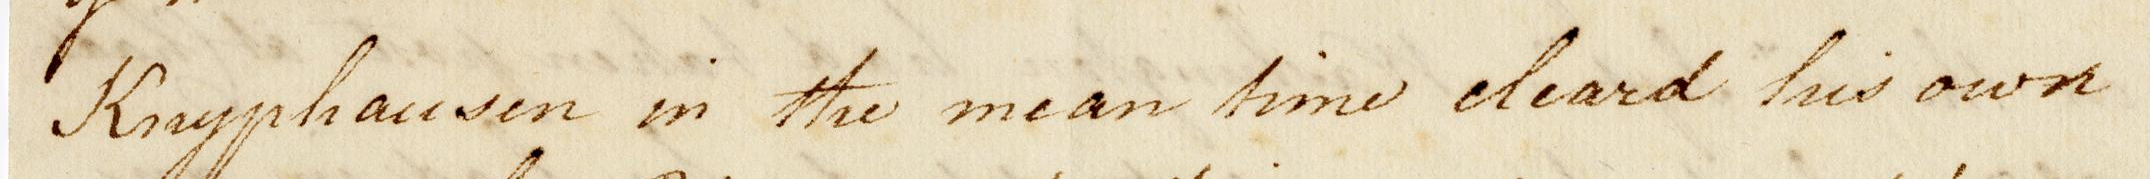Knyphausen in the mean time cleard his own
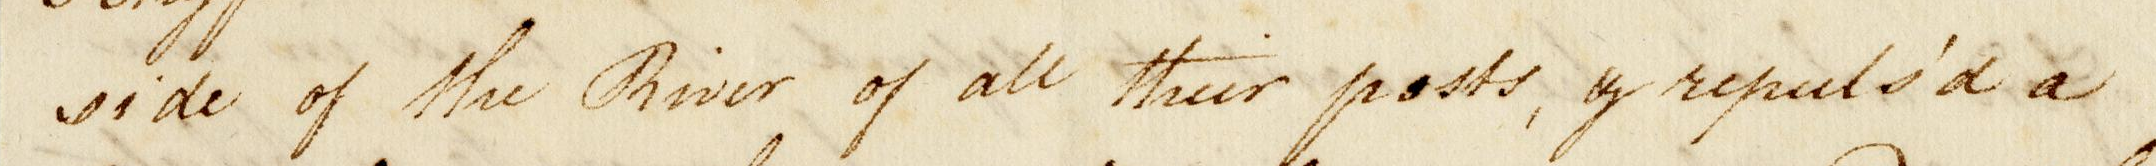side of the River of all their posts, & repuls'd a
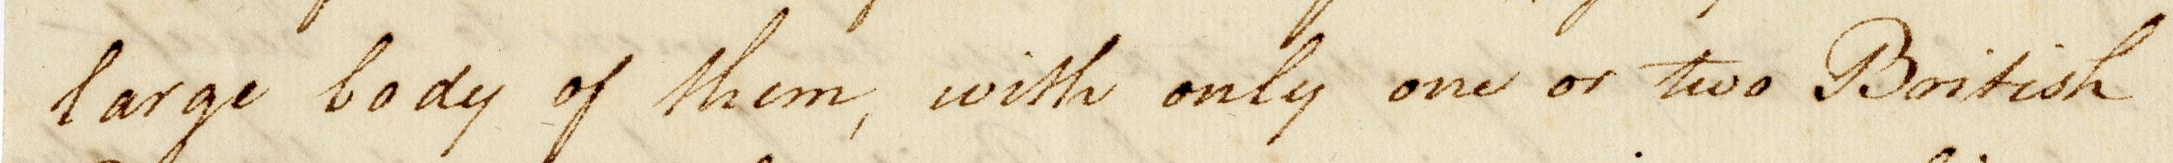large body of them, with only one or two British
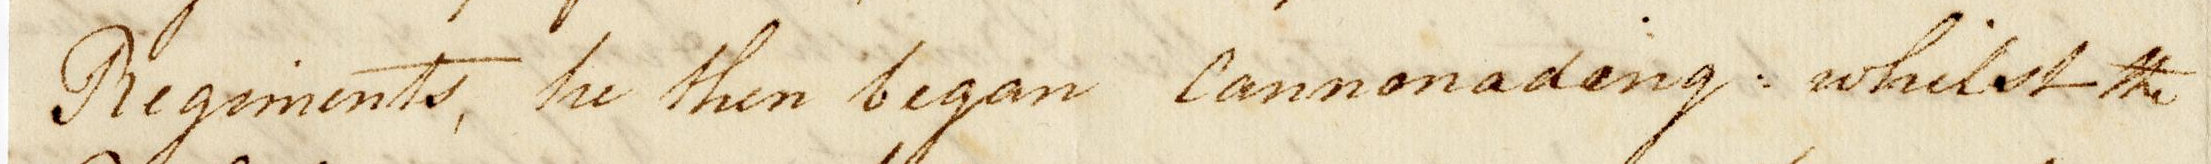Regiments, he then began Cannonading: whilst the
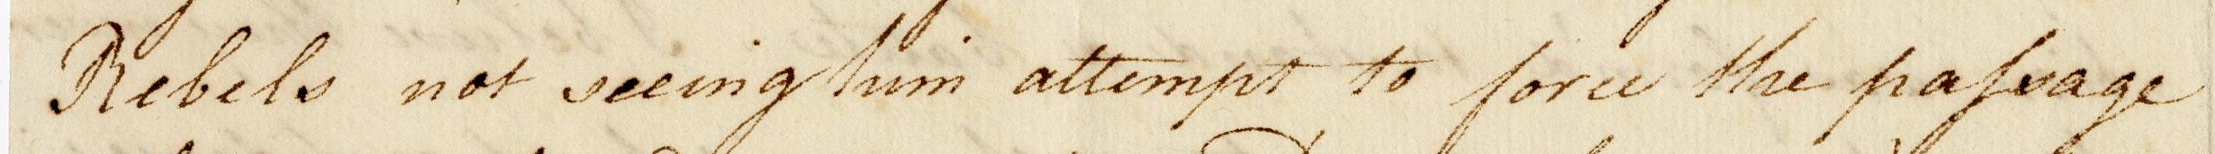Rebels not seeing him attempt to force the passage
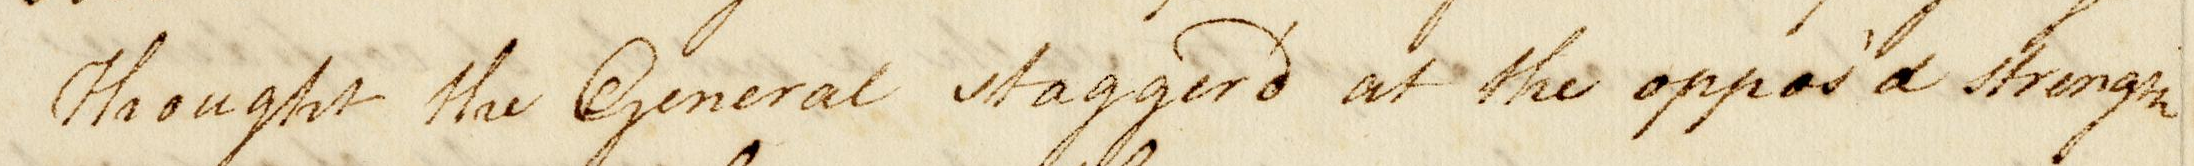thought the General stagger'd at the oppos'd strength
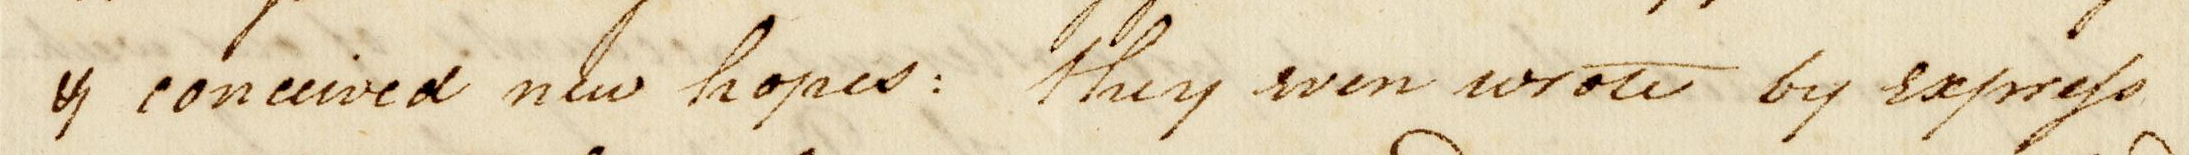& conceived new hopes: they even wrote by Express
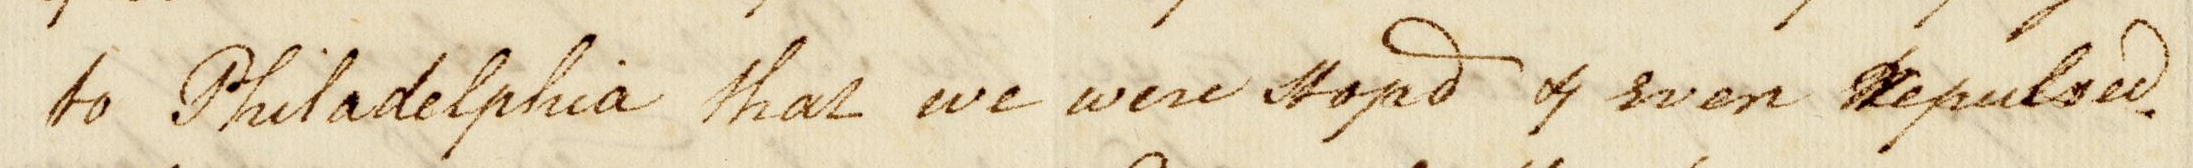to Philadelphia that we were stopd & even repulsed,
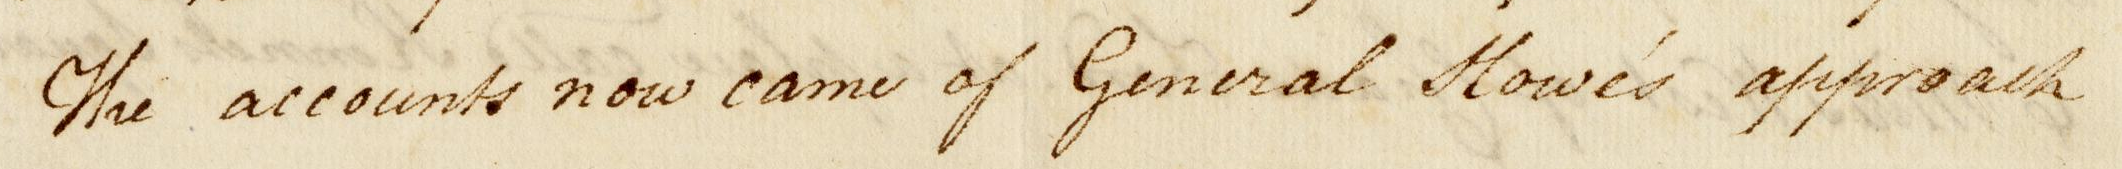The accounts now came of General Howe's approach
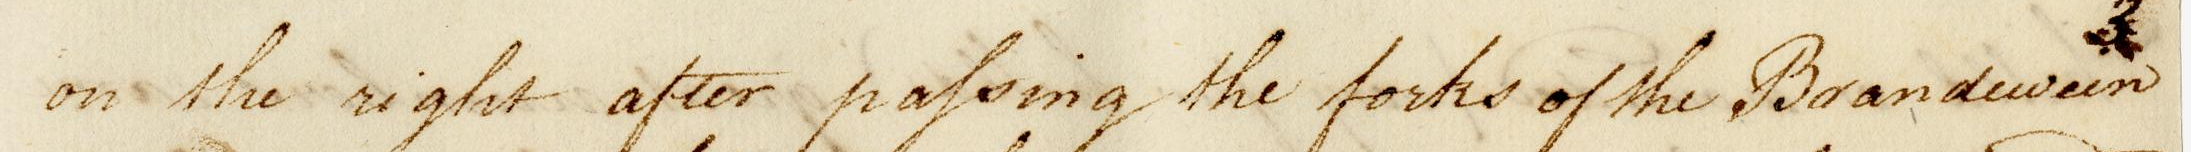on the right after passing the forks of the Brandewein
